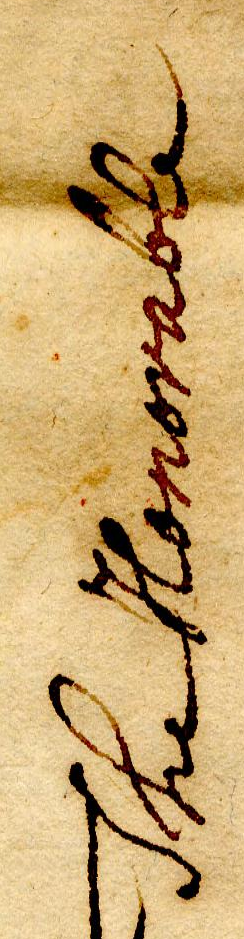The Honorable
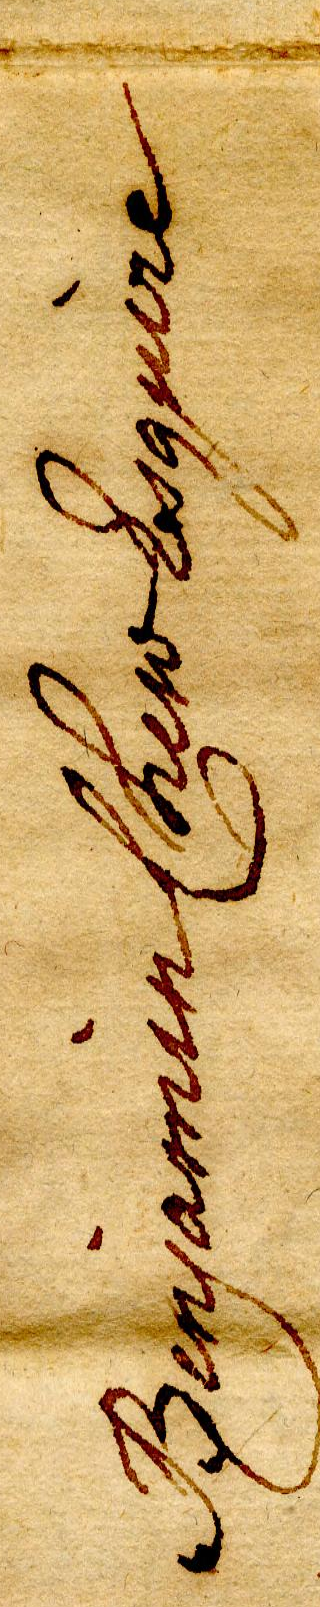Benjamin Chew Esquire
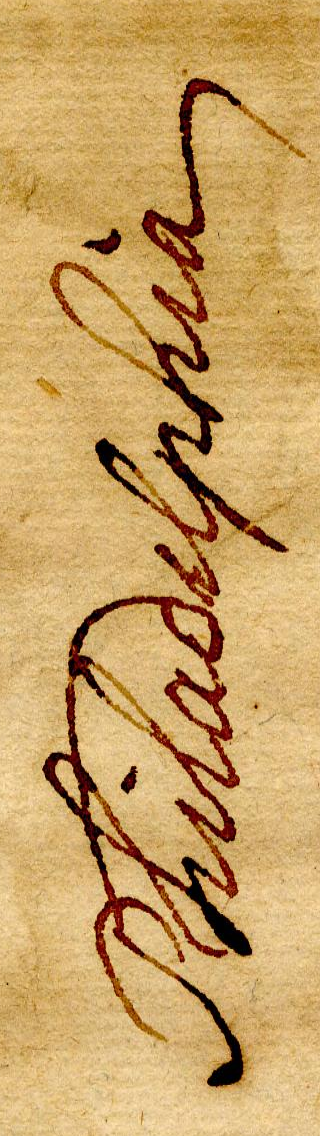Philadelphia
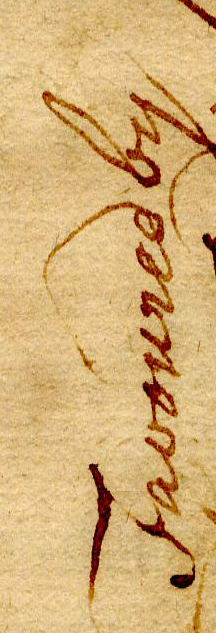Favoured by
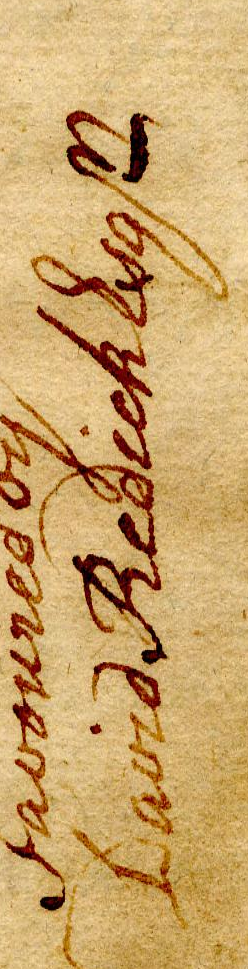David Redick Esq^r
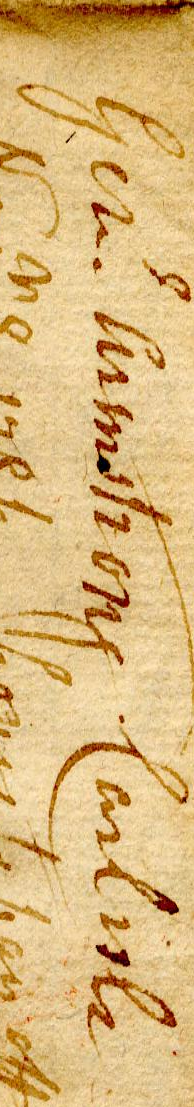Gen^l. Armstrong Carlisle
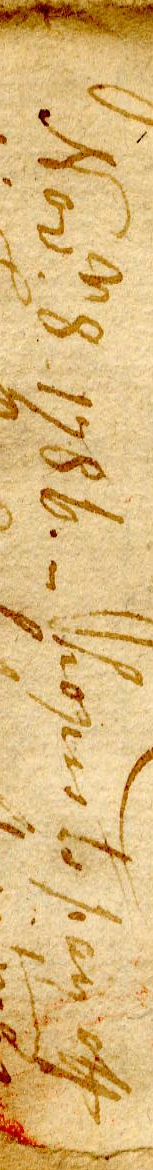Nov^r. 8 1786.-hopes to pay off
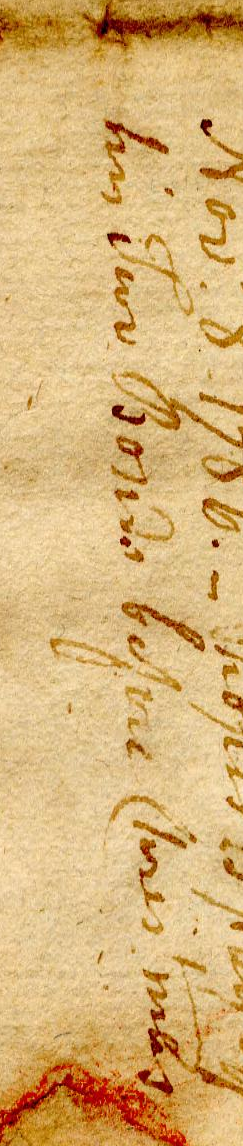his Two Bonds before Christmas
